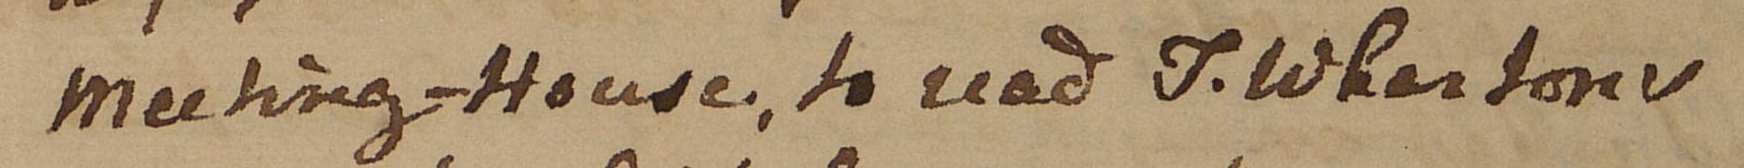meeting-House, to read T. Whartons
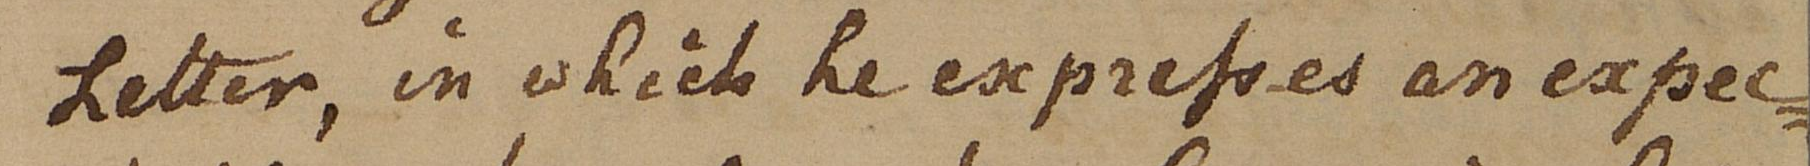Letter, in which he expresses an expec-
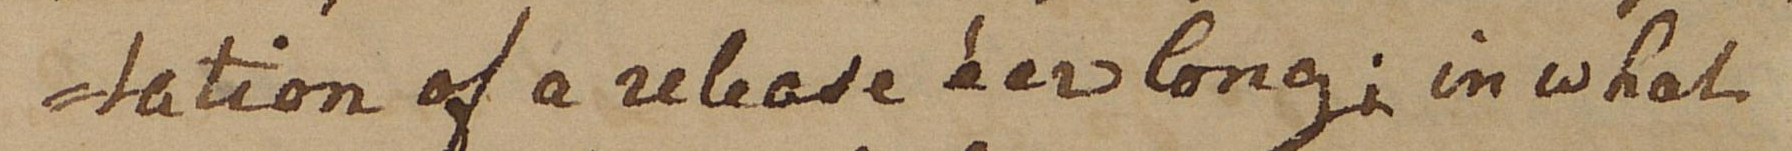-tation of a release [fer] long; in what
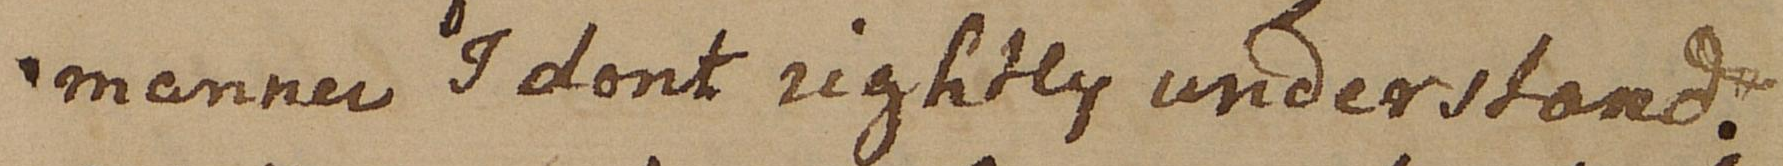manner I dont rightly understand.
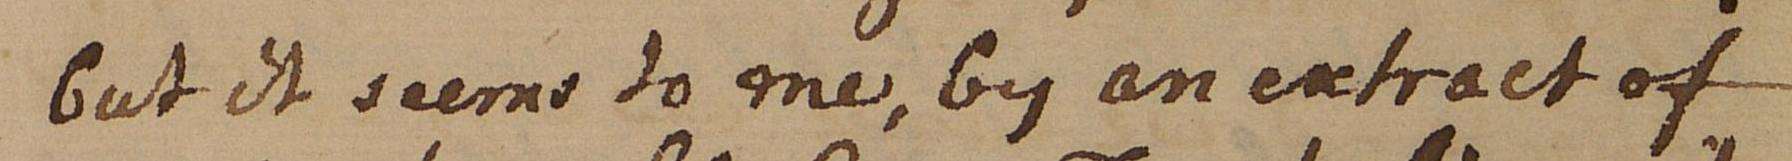but it seems to me, by an extract of
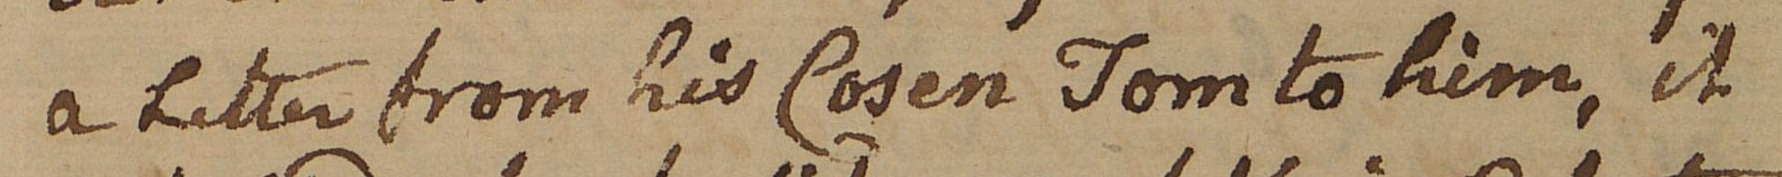a Letter from his Cosen Tom to him, it
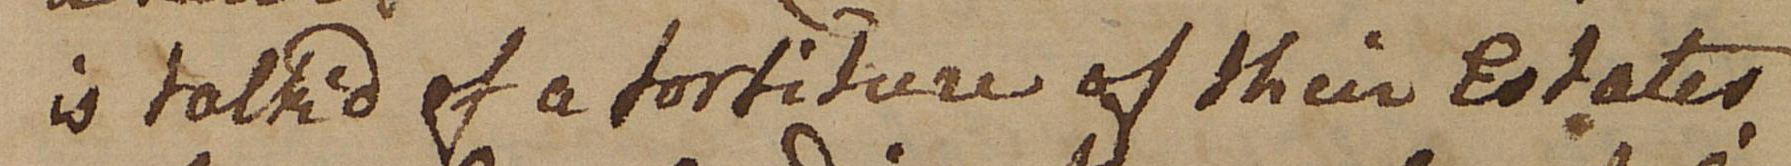is talk'd of a fortiture of their Estates
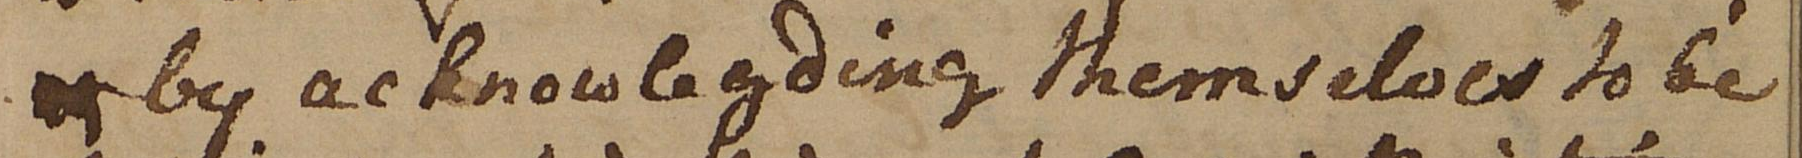[_] by acknowlegding themselves to be
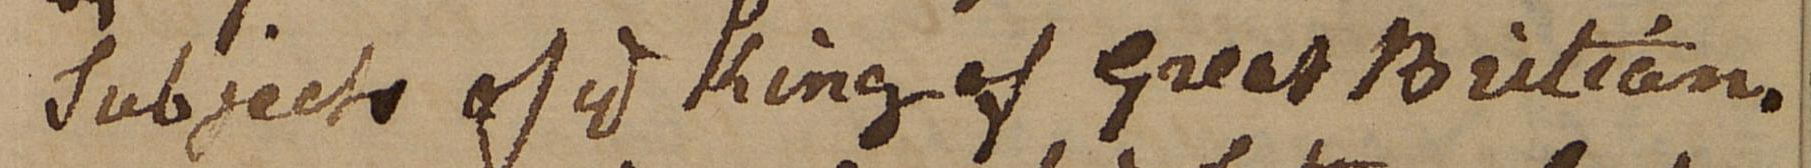Subjects of y^e king of Great Britian.
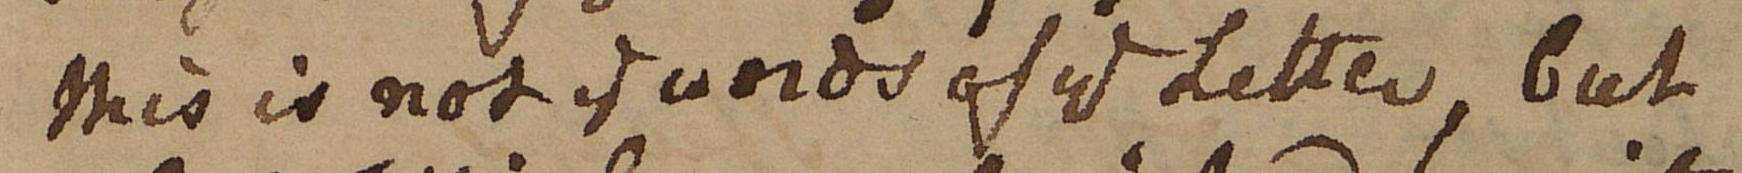this is not y^e words of y^e Letter, but
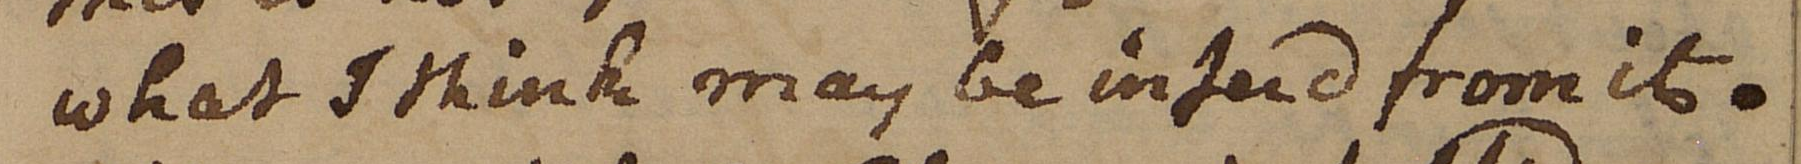what I think may be inferd from it.
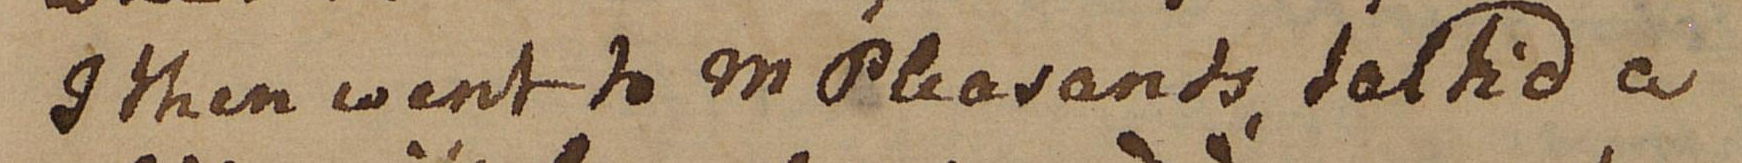I then went to M Pleasants talk'd a
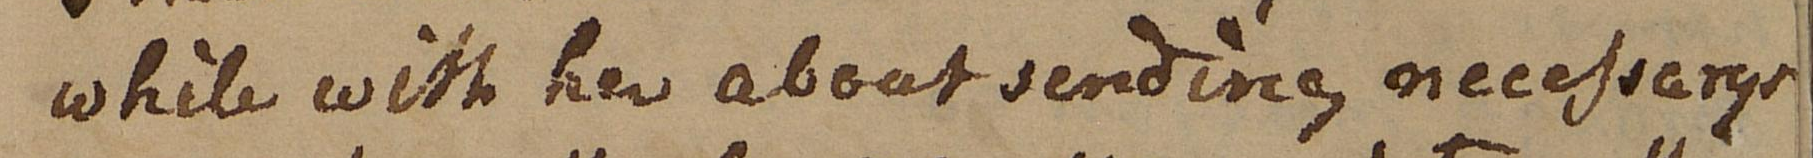while with her about sending necessarys
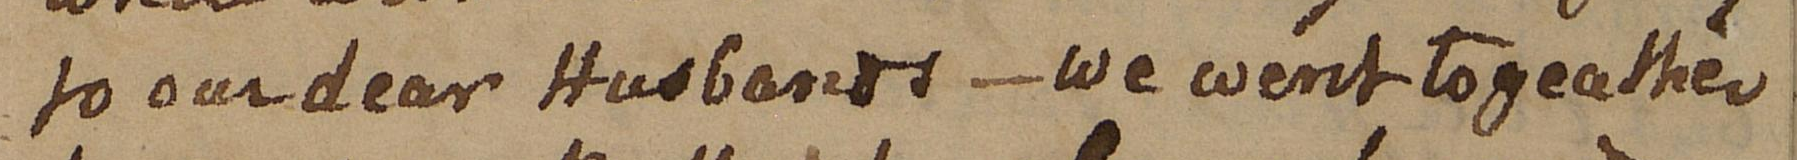so our dear Husbands- we went togeather
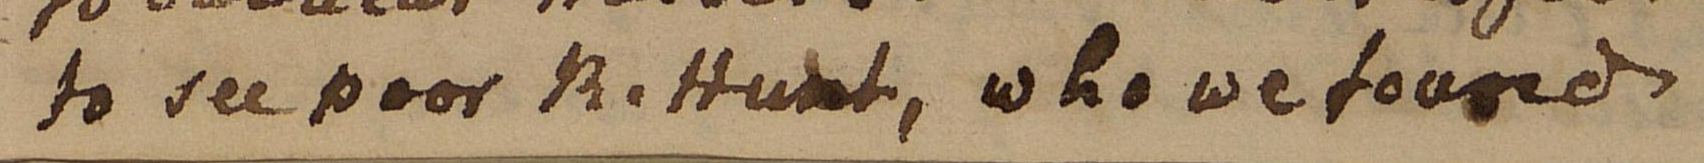to see poor R. Hunt, who we found
